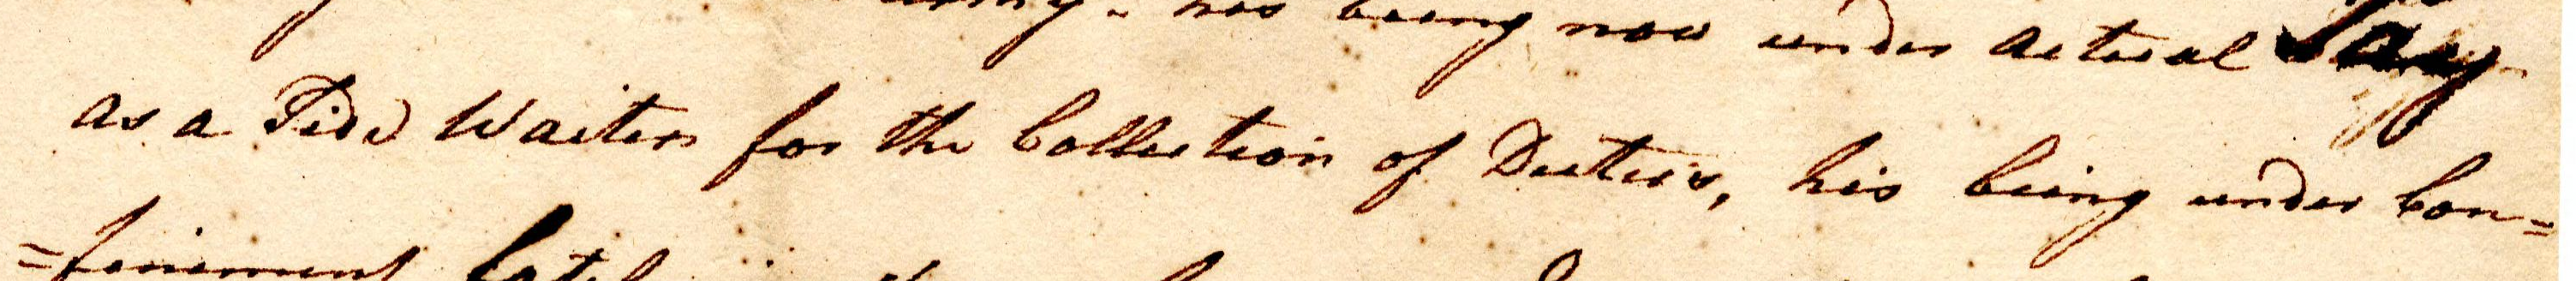as a Tide Waiter for the Collection of Duties, his being under Con-
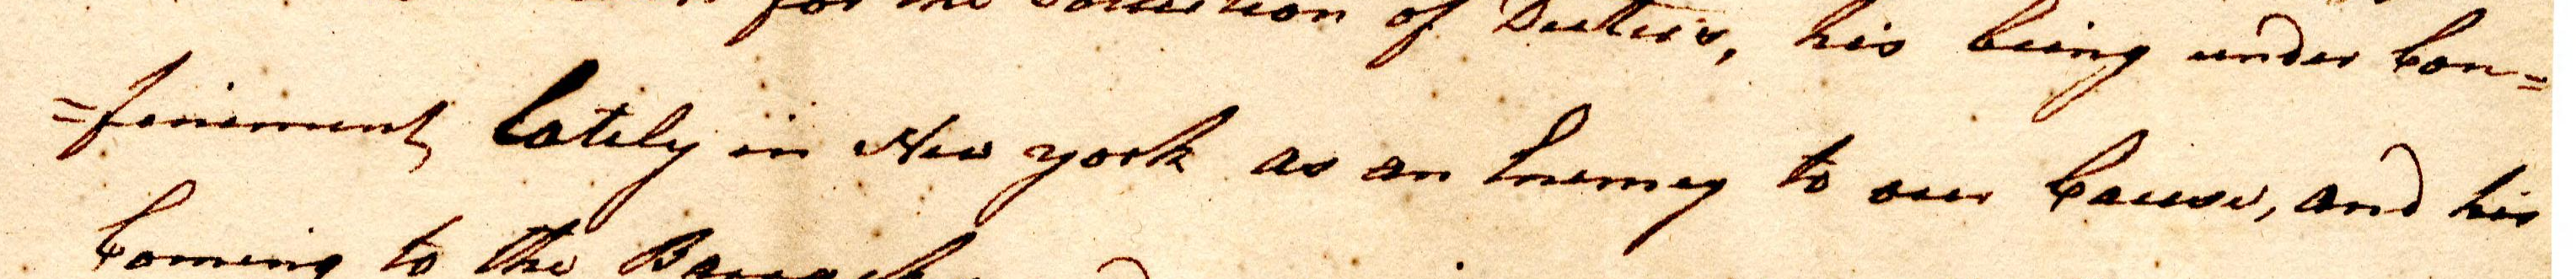-finement lately in New York as an Enemy to our Cause, and his
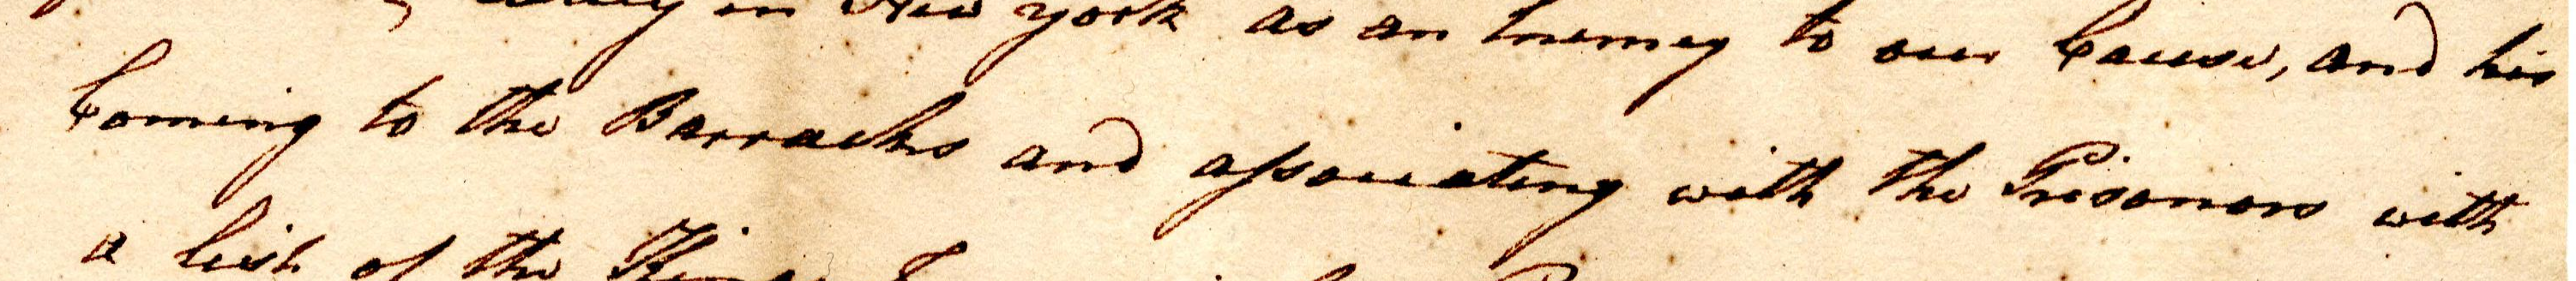Coming to the Barracks and associating with the Prisoners with
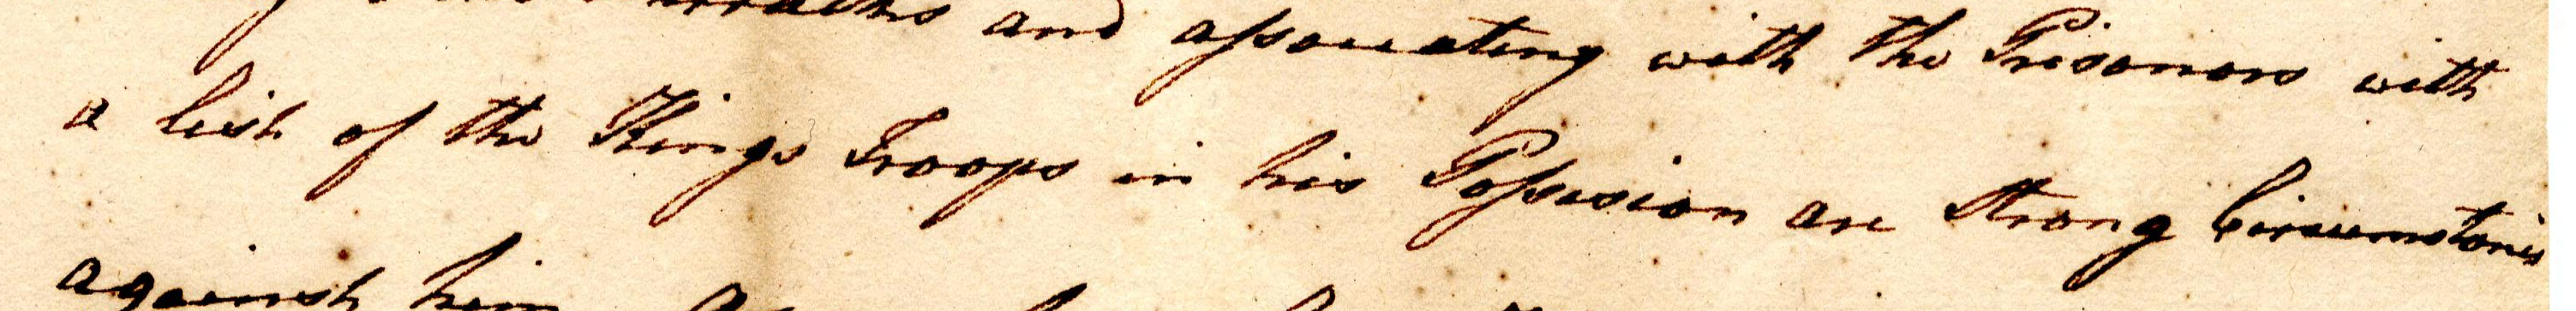a list of the King's Troops in his Possesion are Strong Circumstances
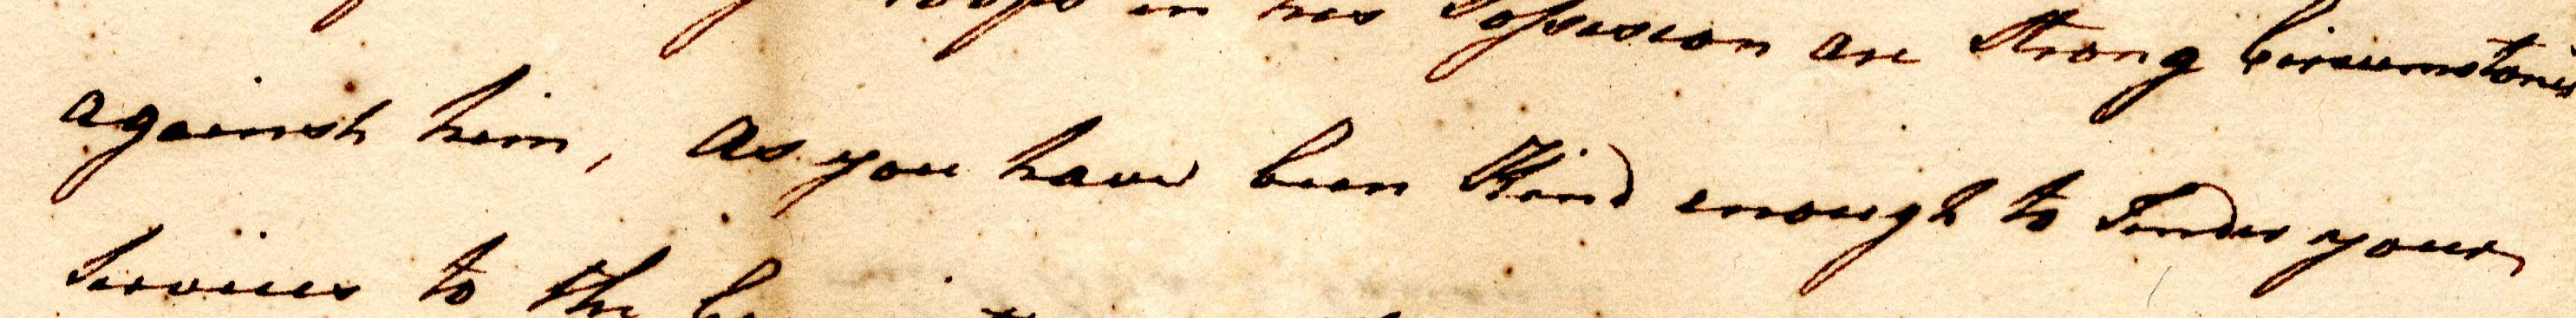against him. As you have been Kind enough to tender your
